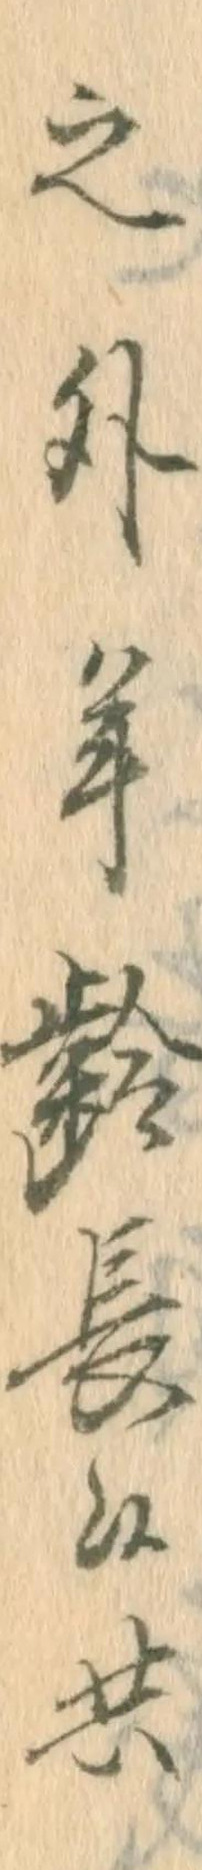之外年齢長候共

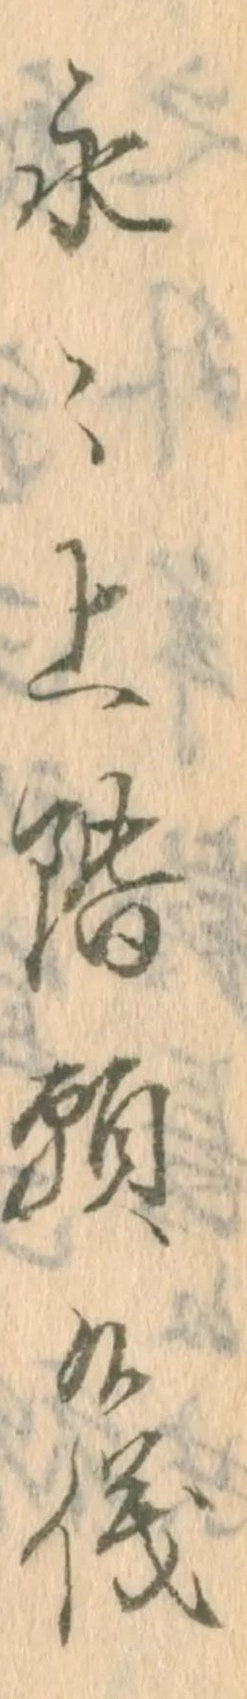永々上階願候儀
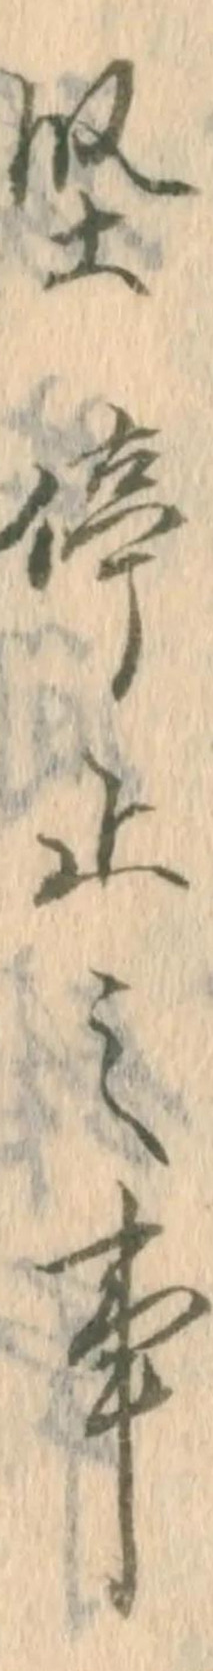堅停止之事
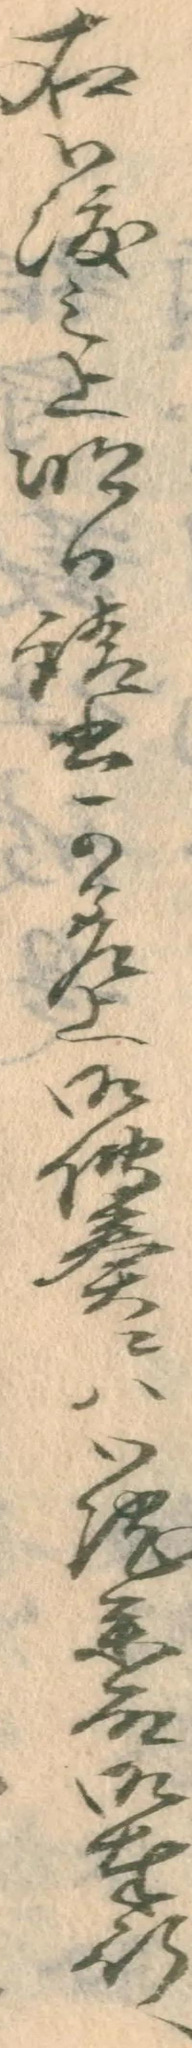右御渡之上明日請書可差上御伝奏ニハ御證参故御奉行へ
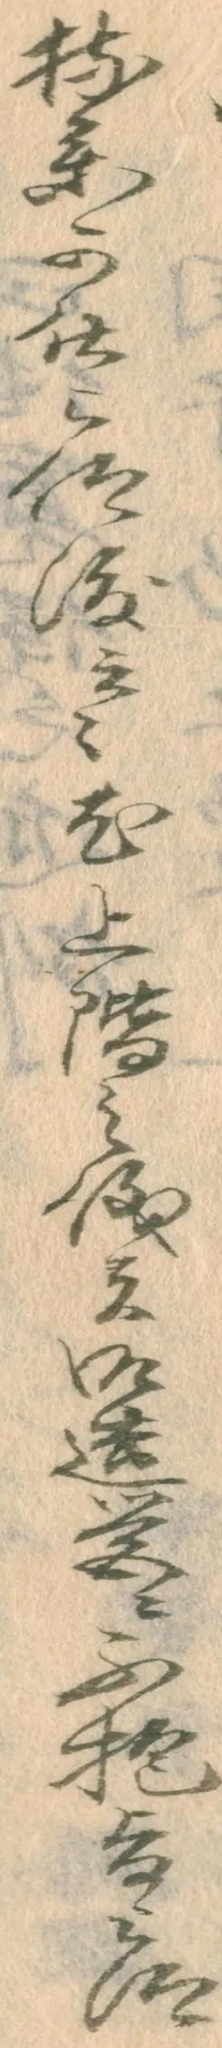持参可仕被仰渡云々尤上階之儀は御造営ニ不拘旨被仰
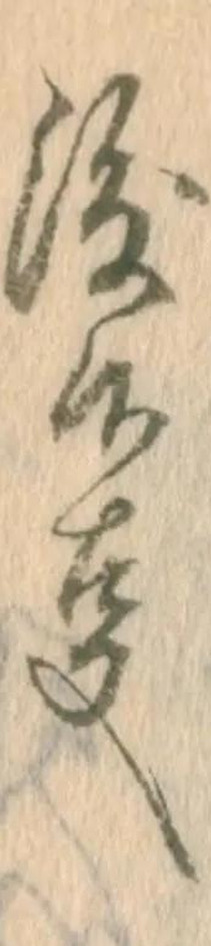渡候事
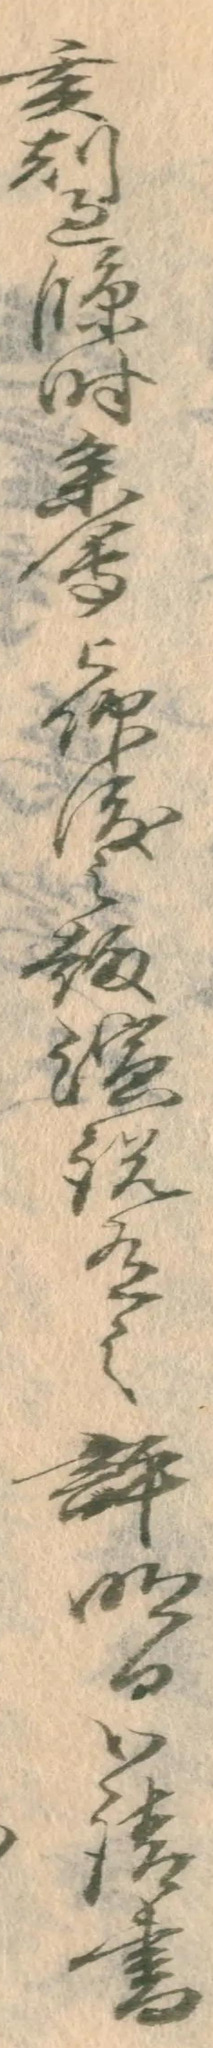一亥刻過臨時参会被仰渡之趣演説有之評明日御請書
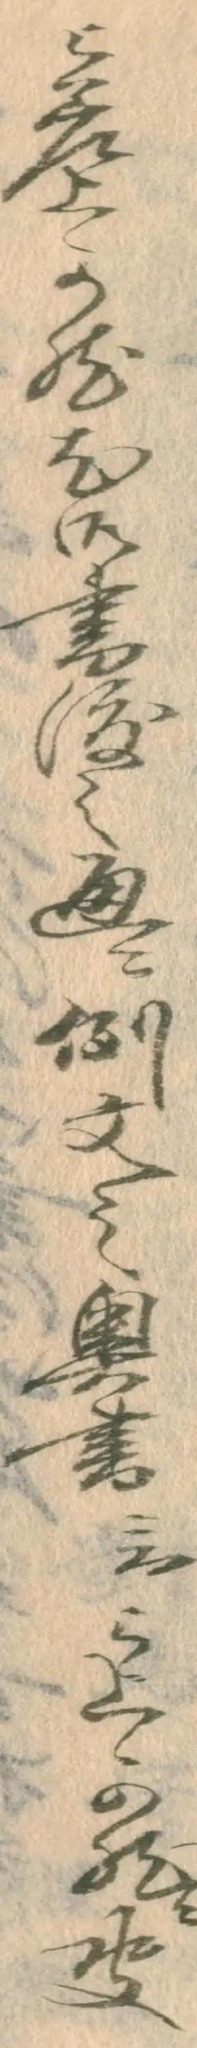被差上可然尤御書渡之通ニ例文之奥書ニ而被上可然ニ決
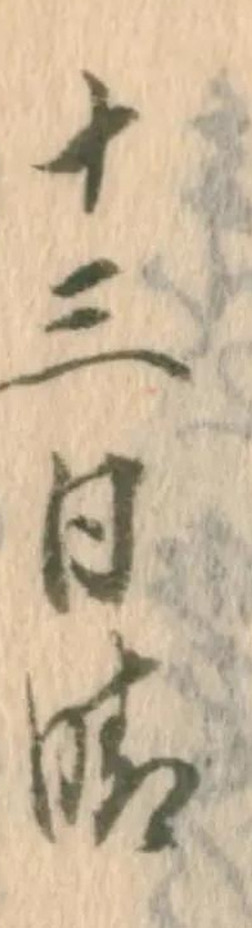十三日晴
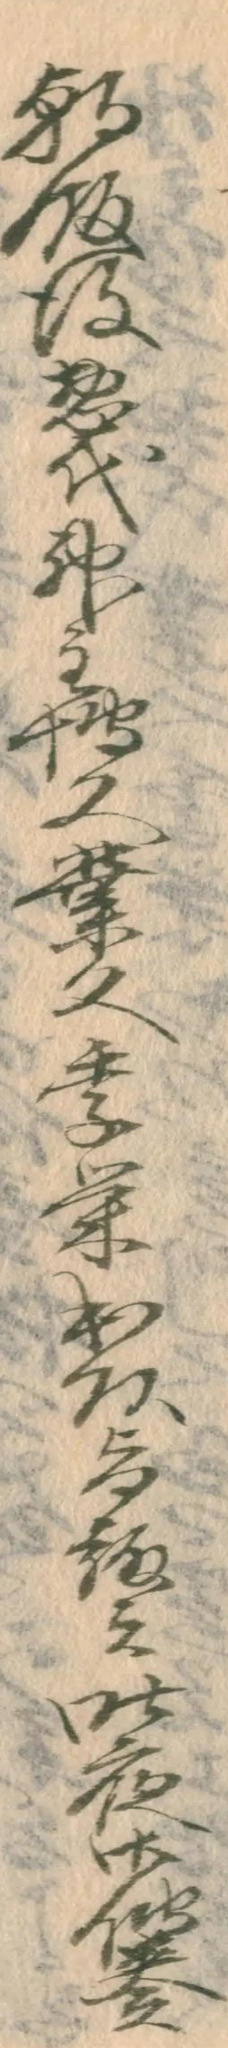一朝飯後惣代神主博久業久季栄出頭旨趣は昨夜御伝奏
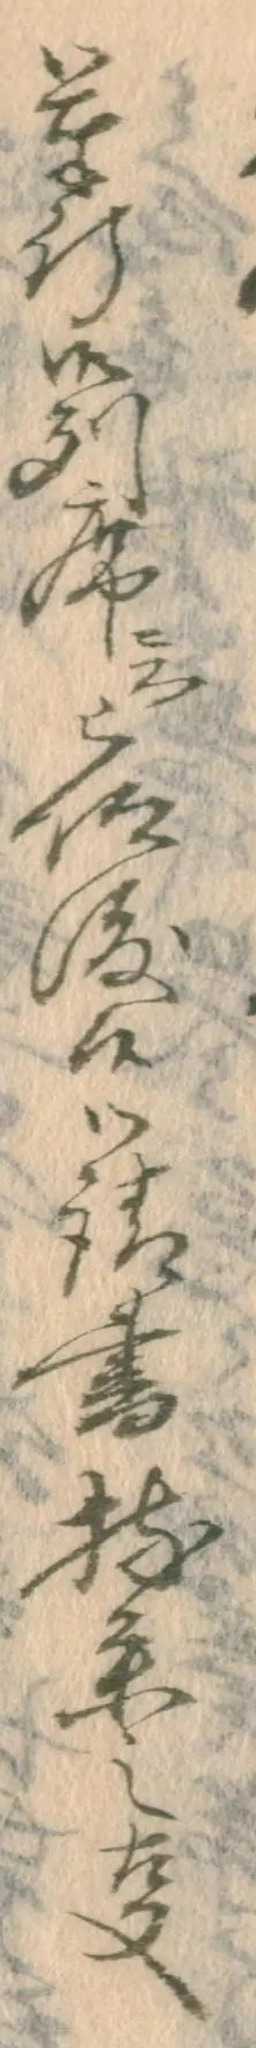御奉行御列席ニ而被仰渡候御請書持参之事
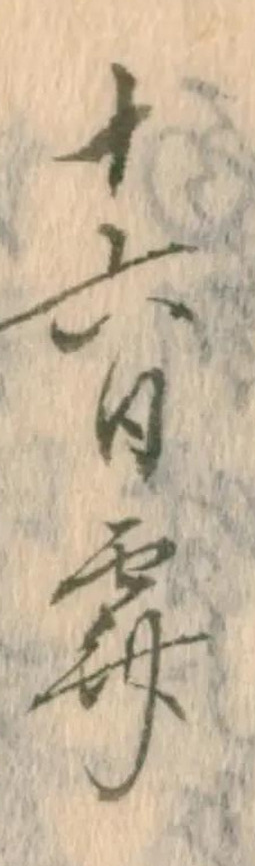十六日霽
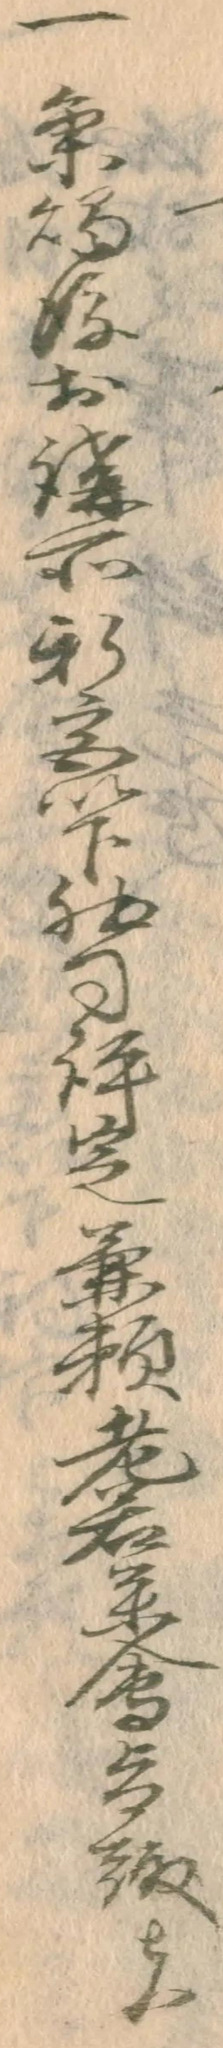一秉燭後於講所新宮以下社司評定兼頼老若参会旨趣者
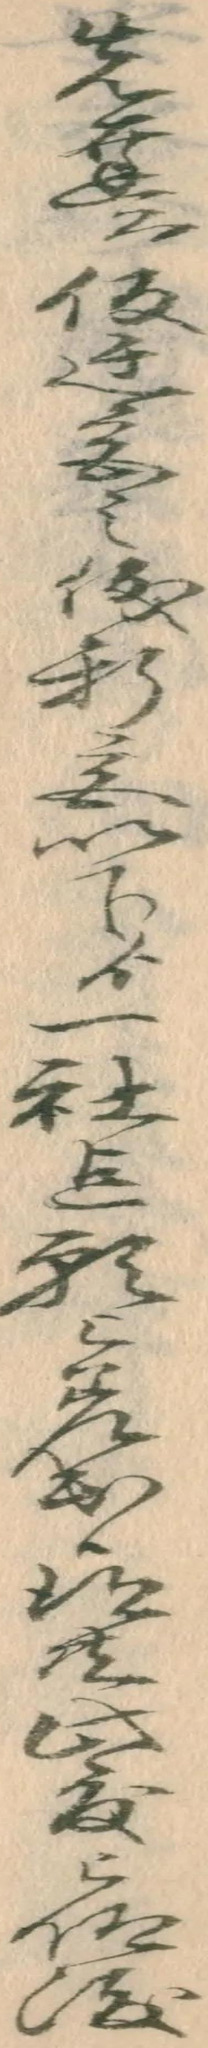先達而仮迁宮之儀新宮以下ゟ一社迄願被差出候得共此度被仰渡
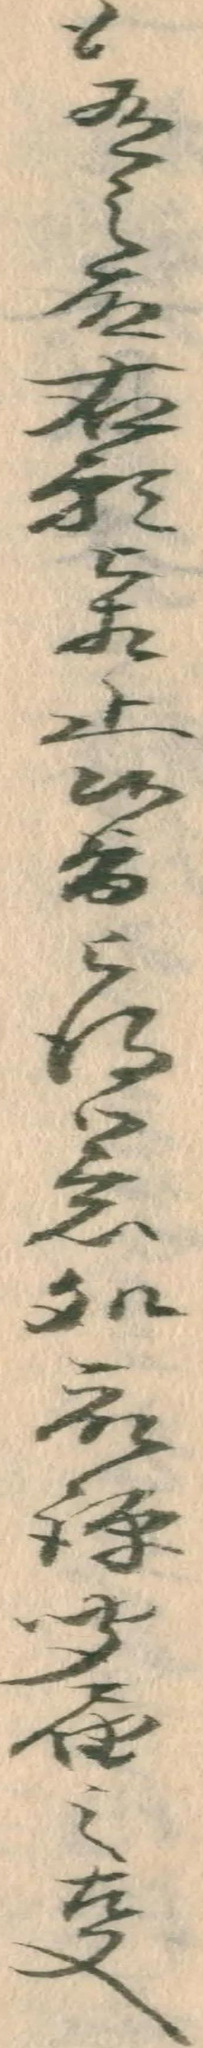も有之故右願被相止候旨被得御意処衆評聞届之事
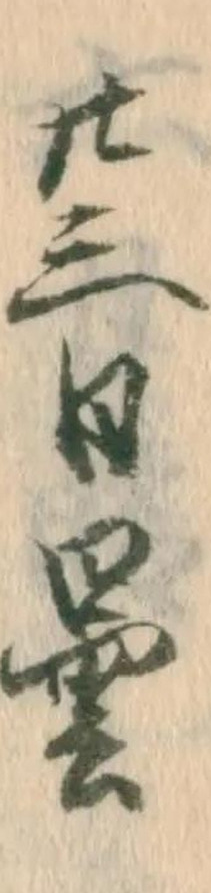廿三日曇
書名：賀茂社記録. 第17冊
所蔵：国立国会図書館 National Diet Library, JAPAN
